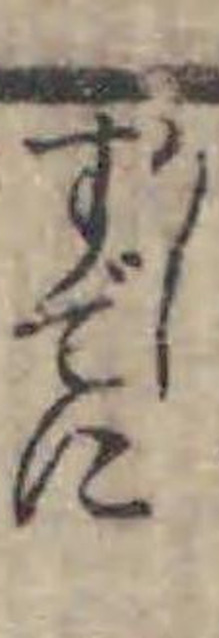すでに
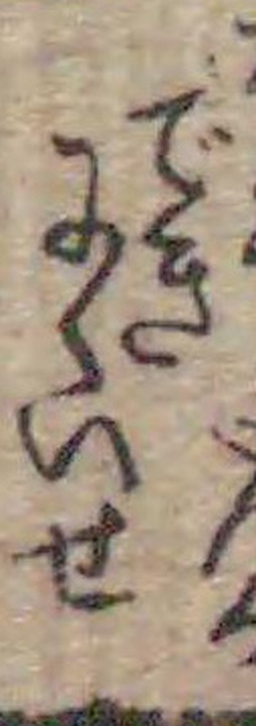にくいせ
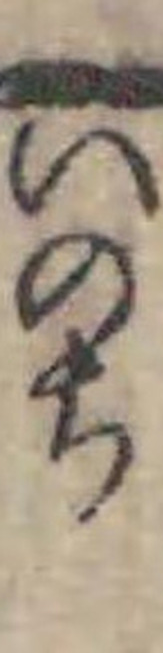いのち
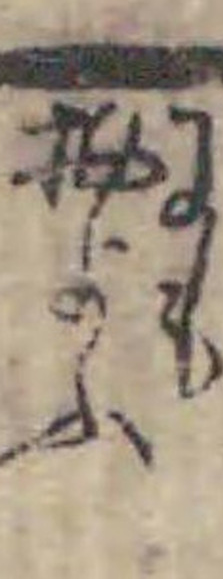およふ
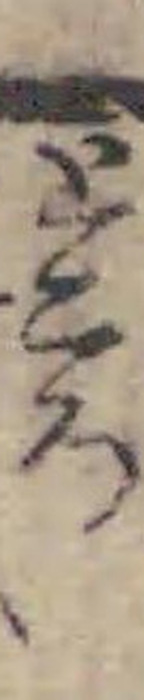ところ
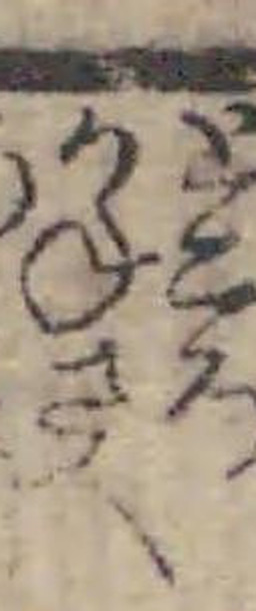かねさへ
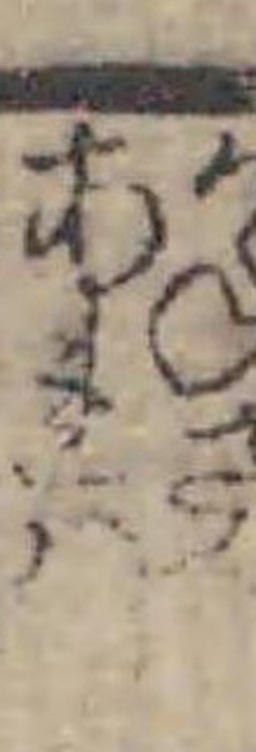あれは
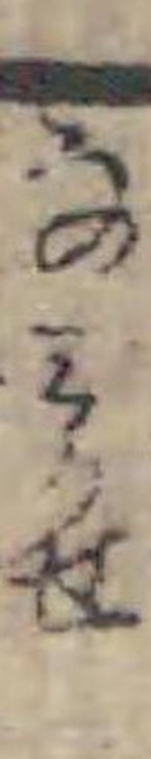なみかせ
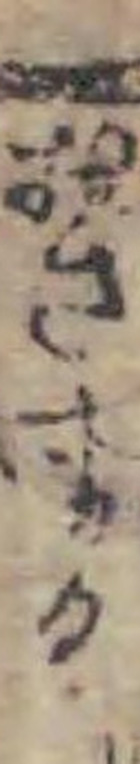おさまる
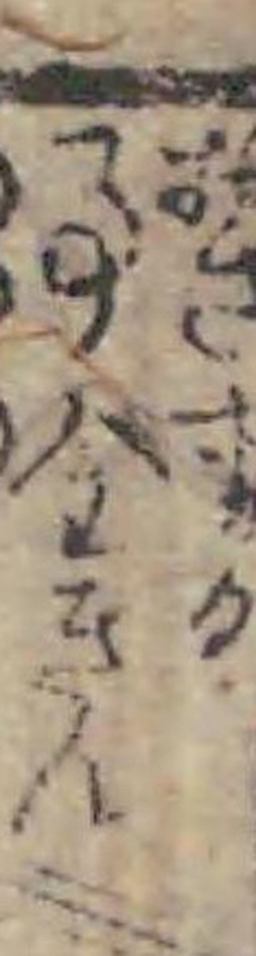事金きん
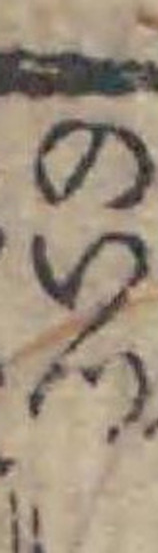のいつ
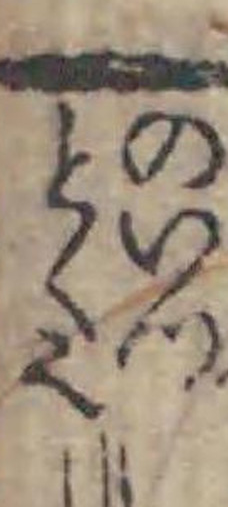とく也
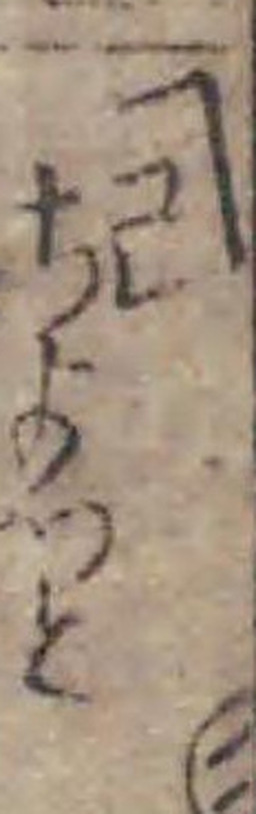ちよつと
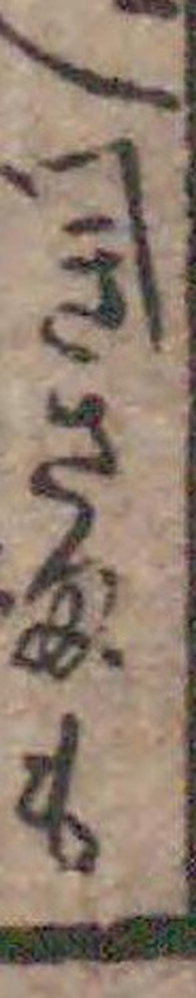〽きさまも
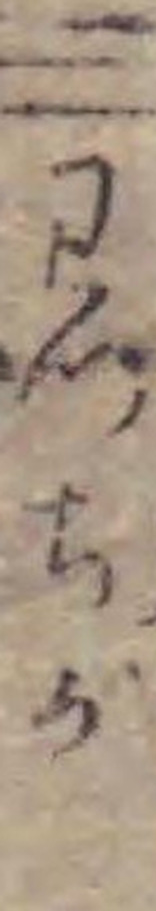わつちが
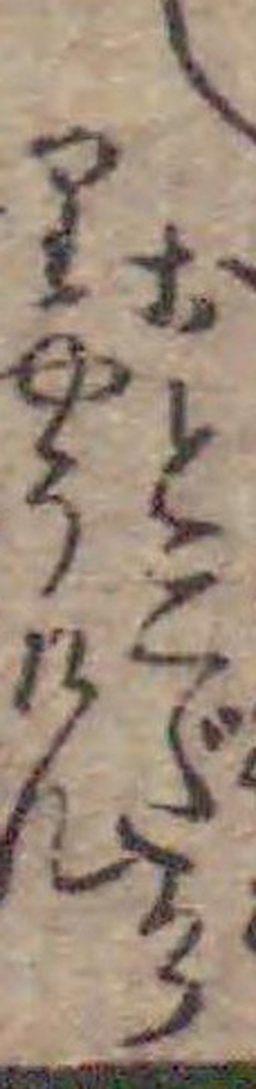りやうけん
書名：新鋳小判 : 3巻
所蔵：国立国会図書館 National Diet Library, JAPAN
